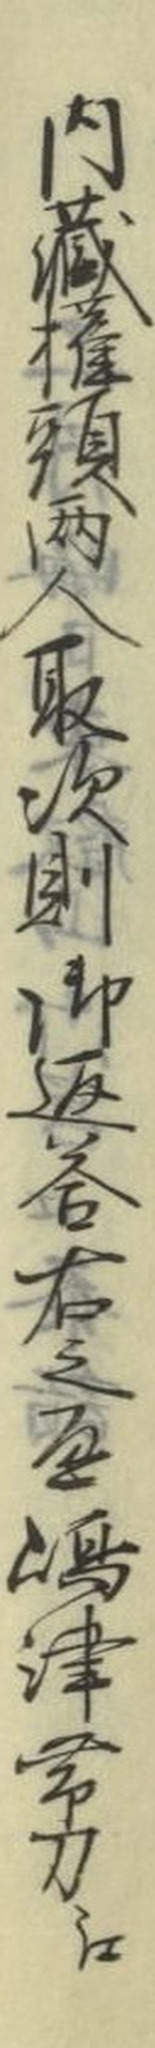内蔵権頭両人取次則御返答右之通島津帯刀え
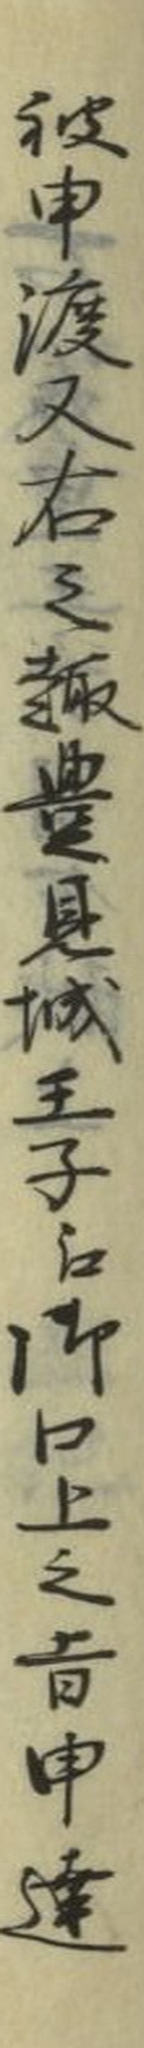被申渡又右之趣豊見城王子え御口上之旨申達
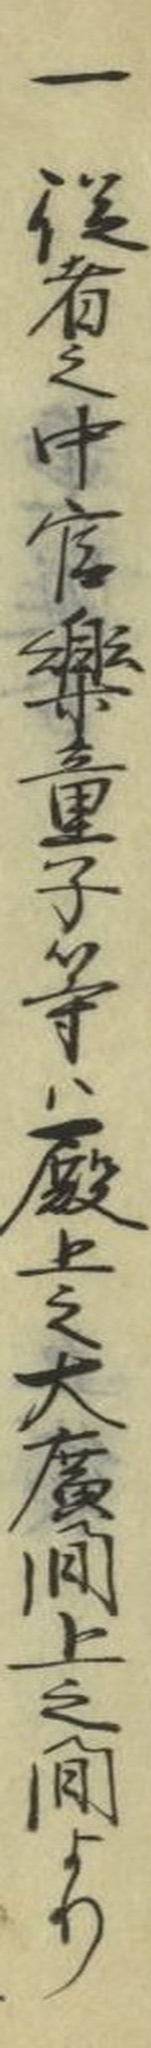一従者之中官楽童子等は殿上之大広間上之間より
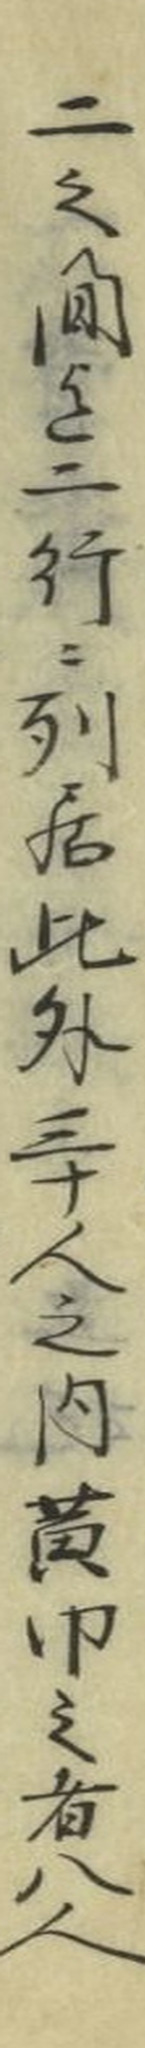二之間迄二行に列居此外三十人之内黄巾之者八人
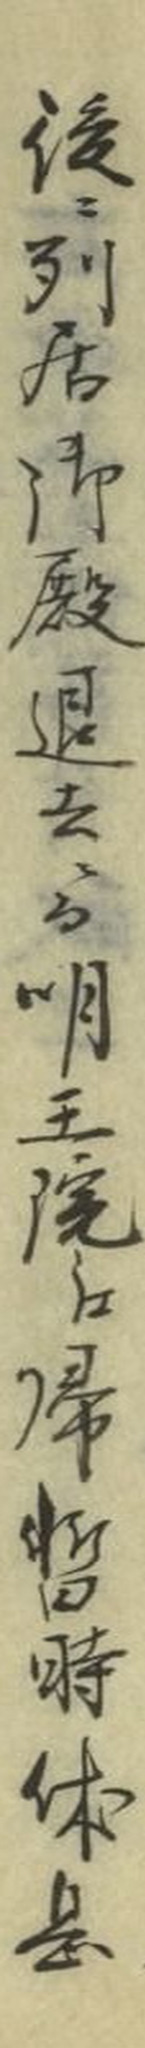後に列居御殿退去に而明王院え帰暫時休息
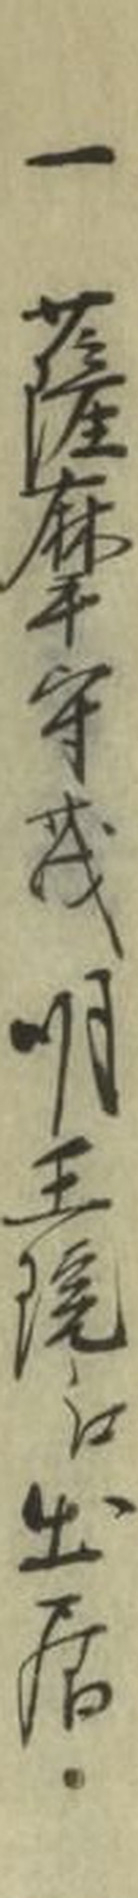一薩摩守も明王院え出居
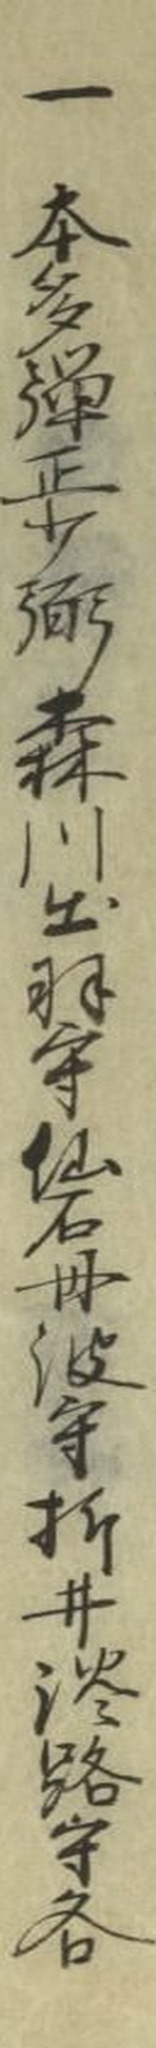一本多弾正少弼森川出羽守仙石丹波守折井淡路守各
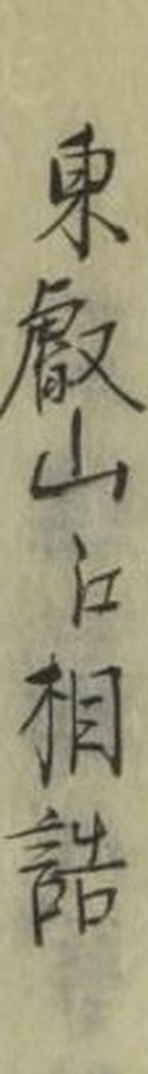東叡山え相詰
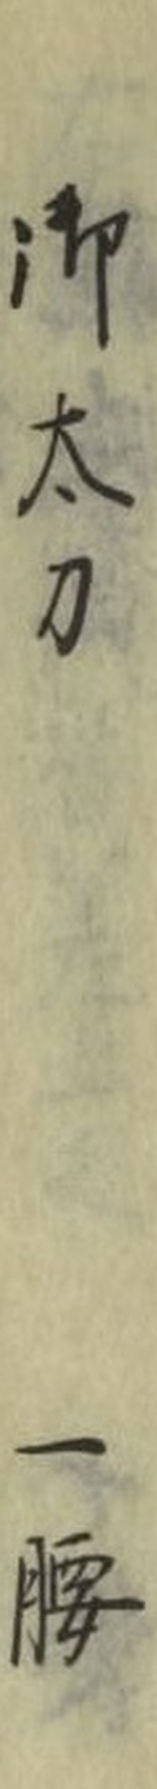御太刀一腰
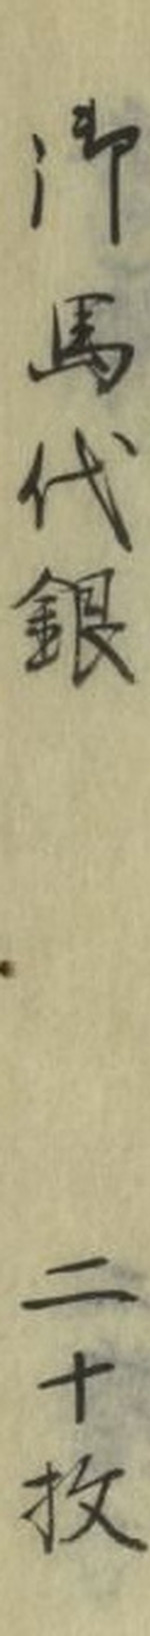御馬代銀二十枚

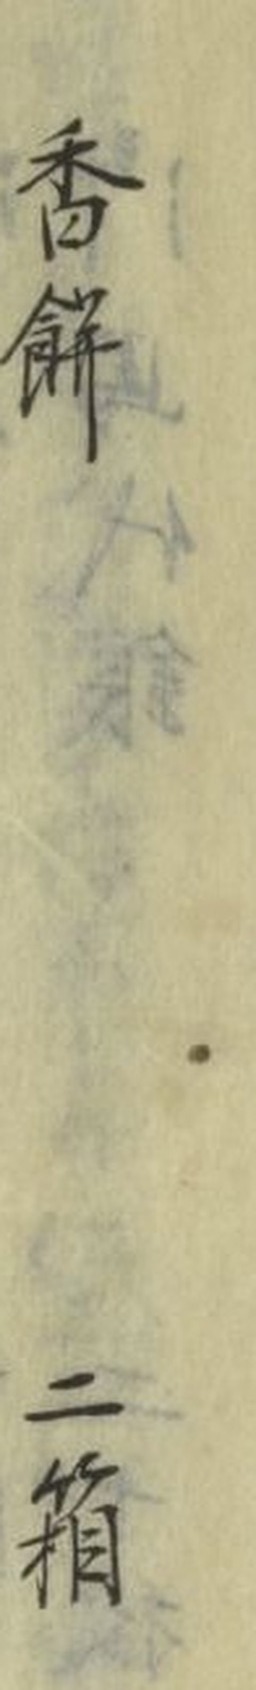香餅二箱
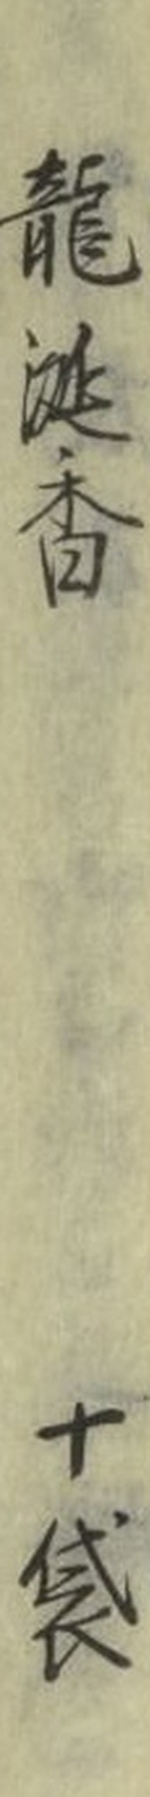龍涎香十袋
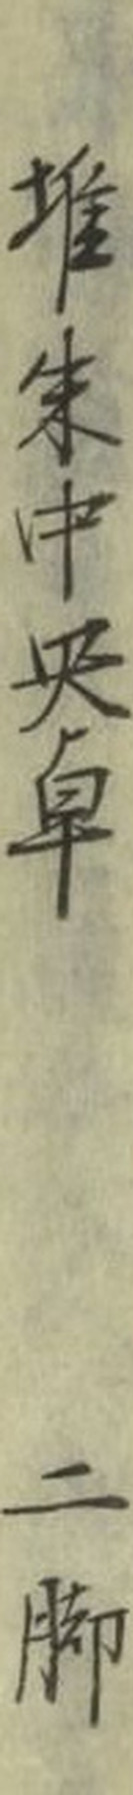堆朱中央卓二脚
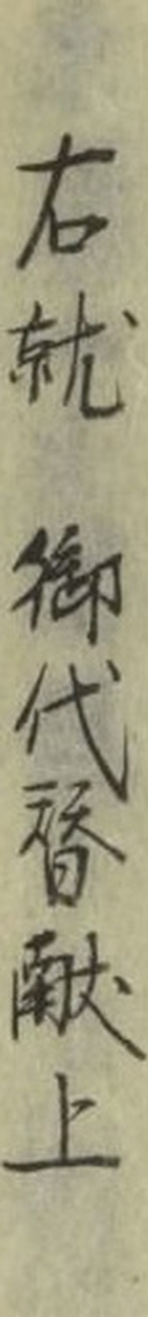右就御代替献上
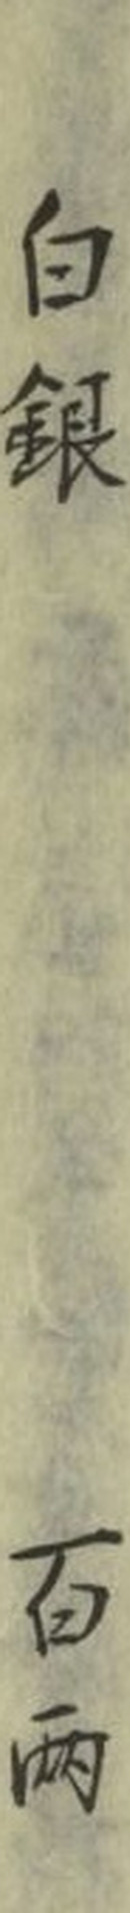白銀百両
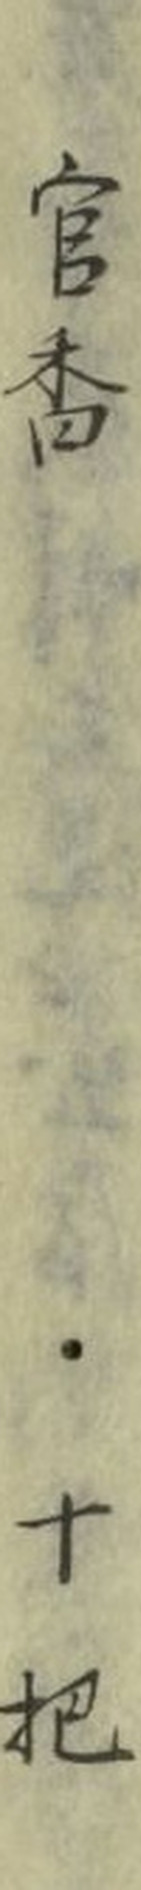官香十把
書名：宝永七庚寅年琉球国来聘使日記
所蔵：University of the Ryukyus Library
